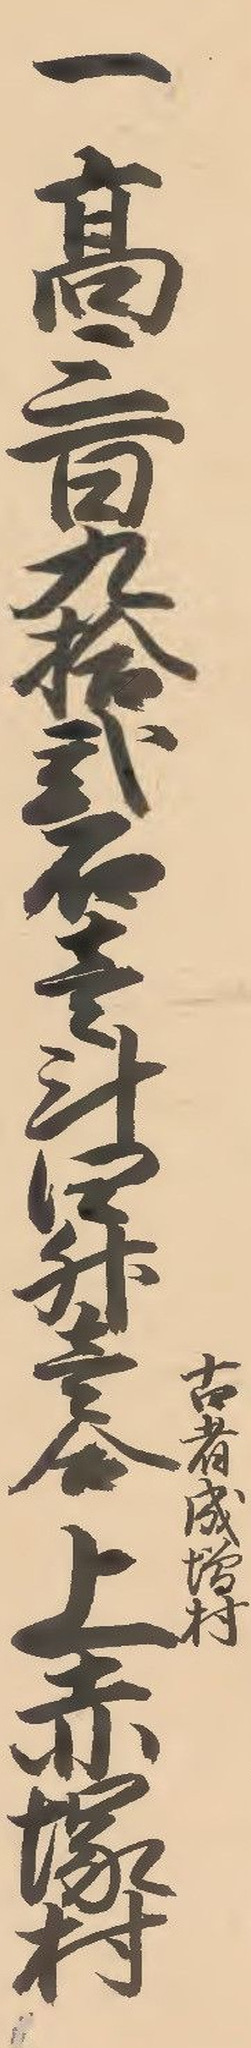一高三百九拾弐石壱斗四升壱合上赤塚村
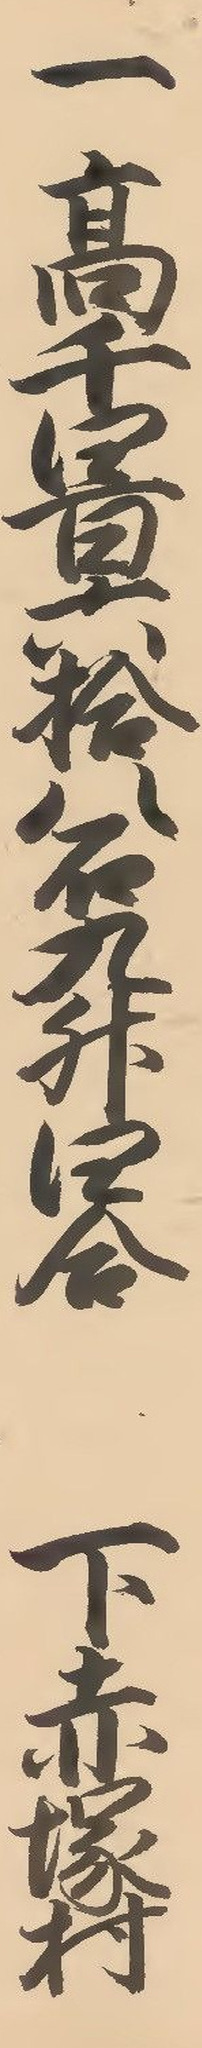一高千四百六拾八石九升四合下赤塚村
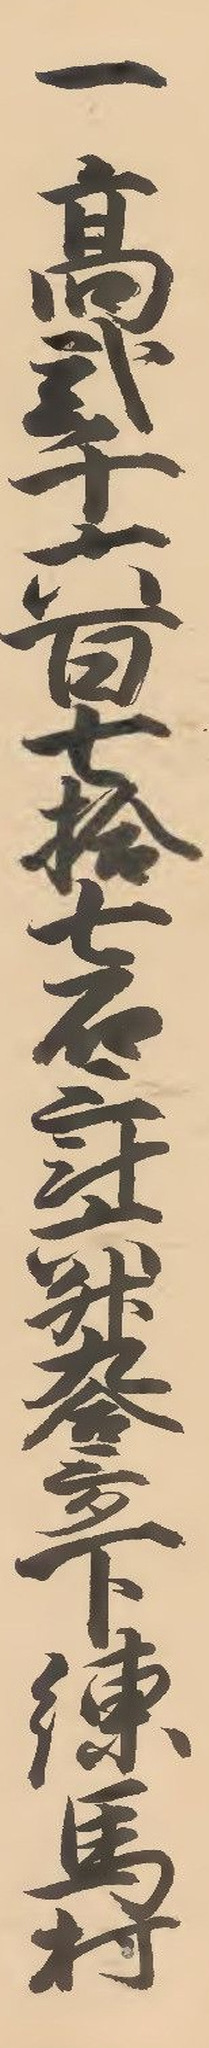一高弐千六百七拾七石三斗六升九合三勺下錬馬村
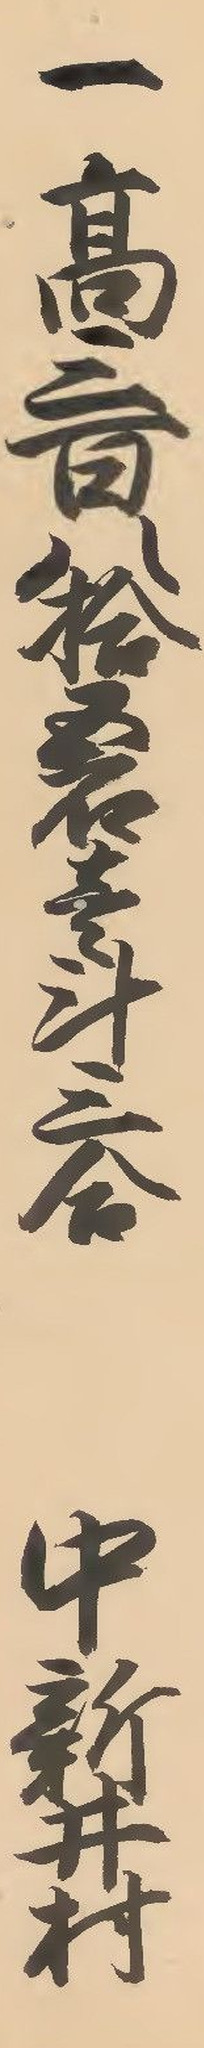一高三百八拾五石壱斗三合中新井村

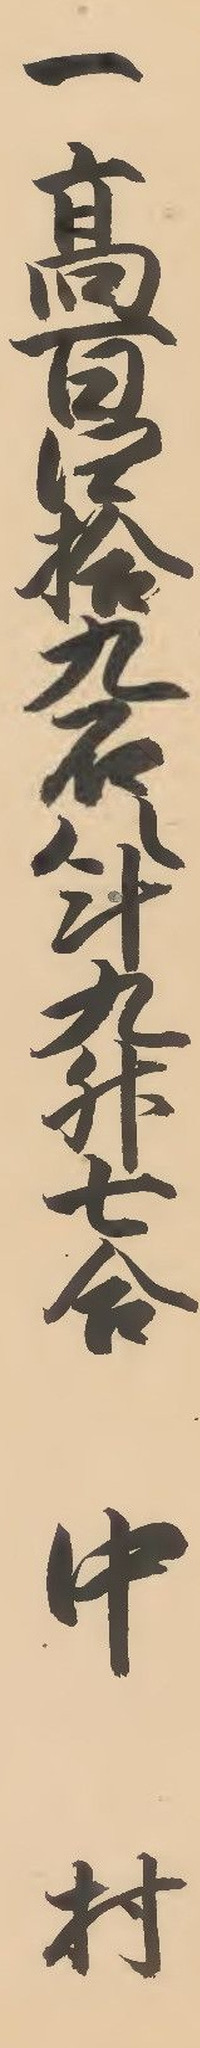一高百四拾九石八斗九升七合中村
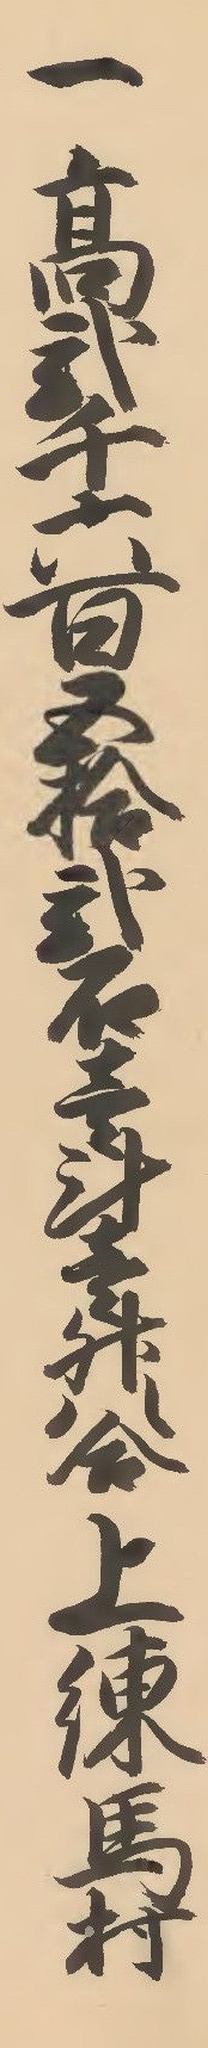一高弐千六百五拾弐石壱斗壱升八合上練馬村
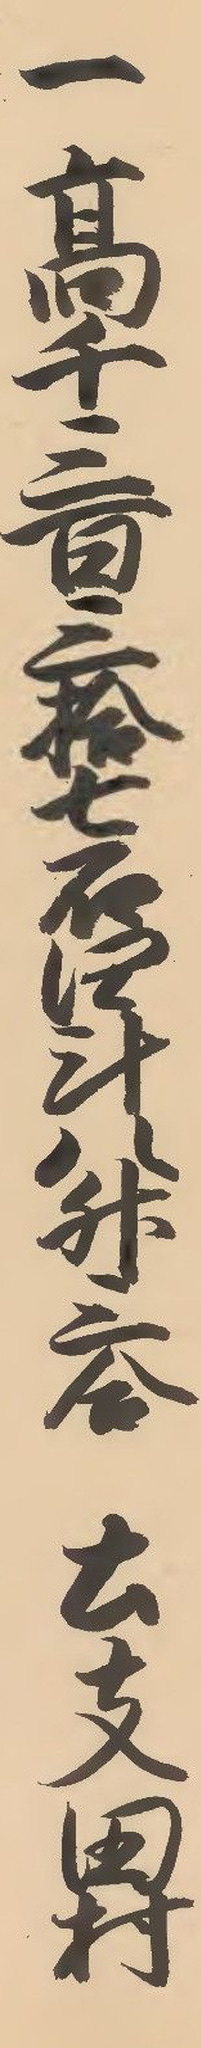一高千三百三拾七石四斗八升三合土支田村
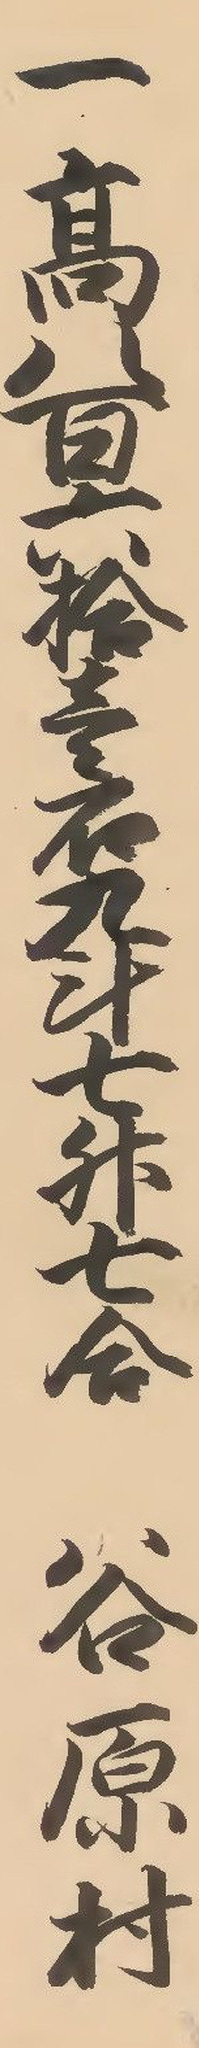一高八百六拾壱石九斗七升七合谷原村
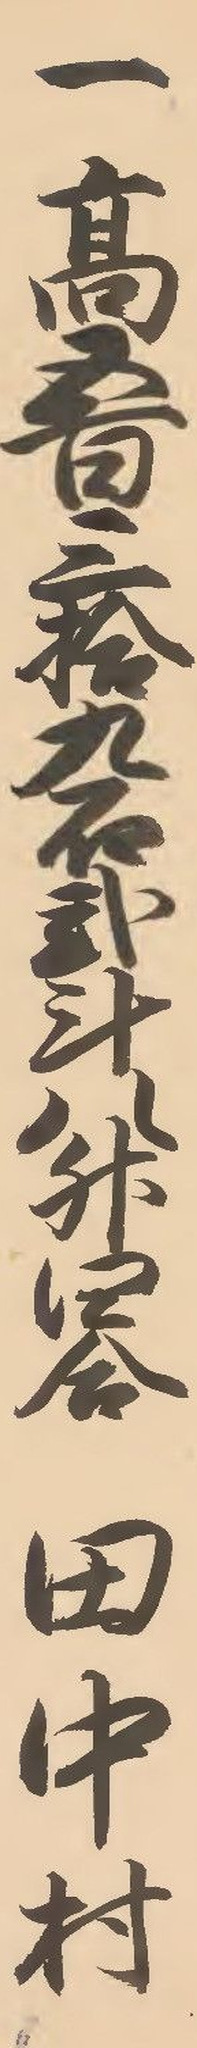一高五百三拾九石弐斗八升四合田中村
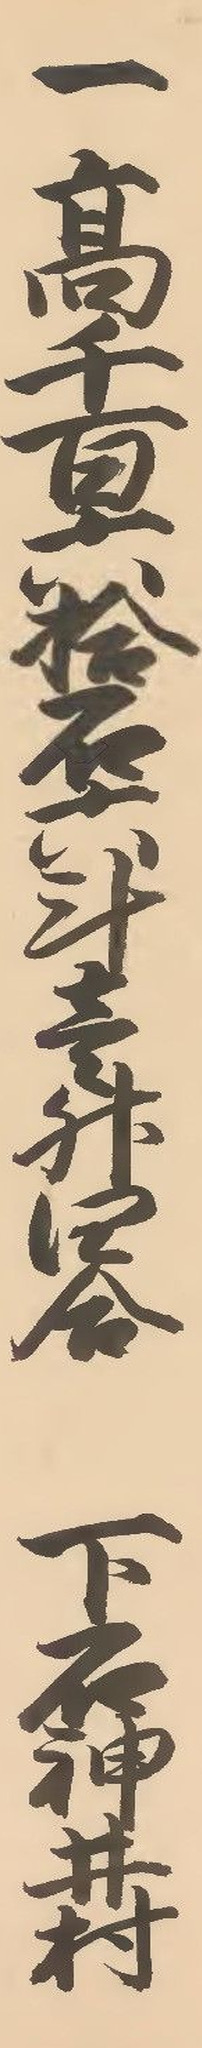一高千百六拾石六斗壱升四合下石神井村
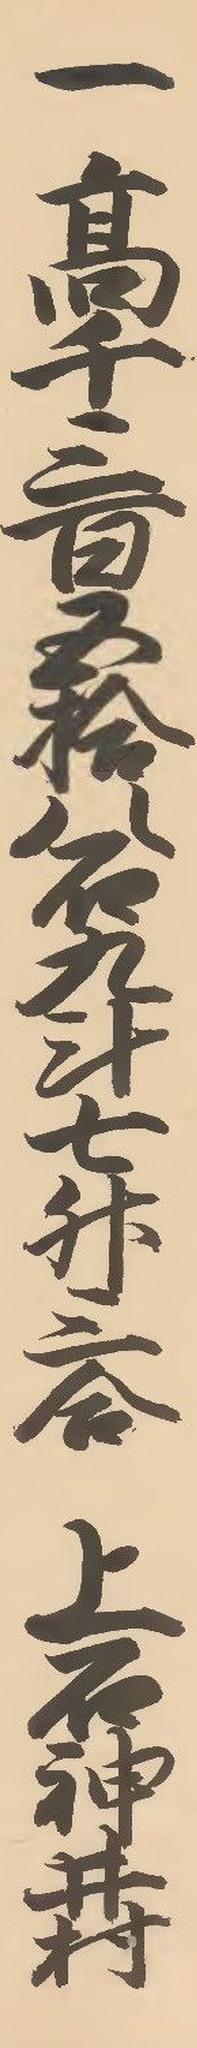一高千三百五拾八石九斗七升三合上石神井村
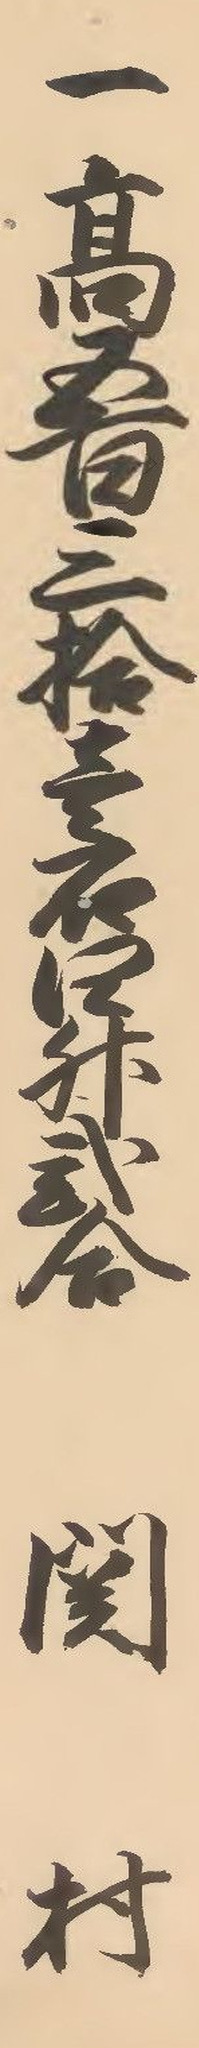一高五百三拾壱石四升弐合関村

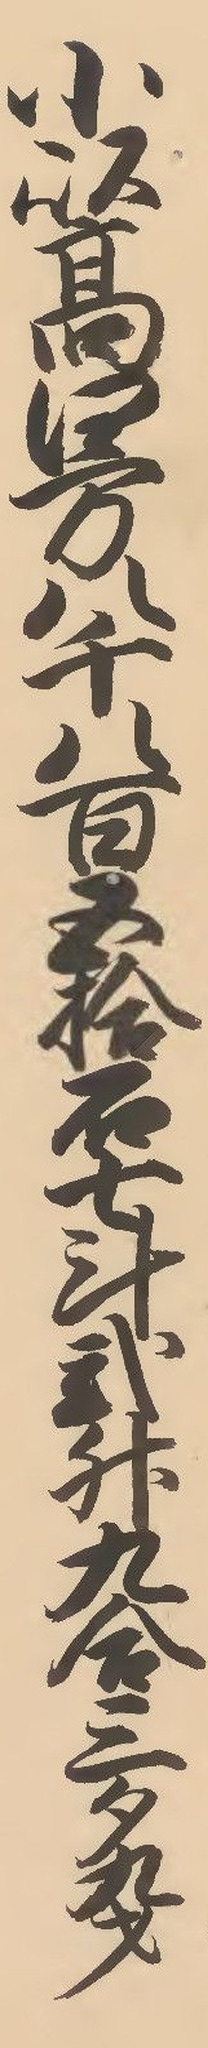小以高四万八千八百五拾石七斗弐升九合三勺九才
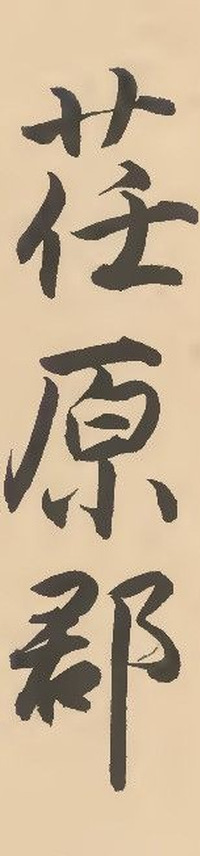荏原郡
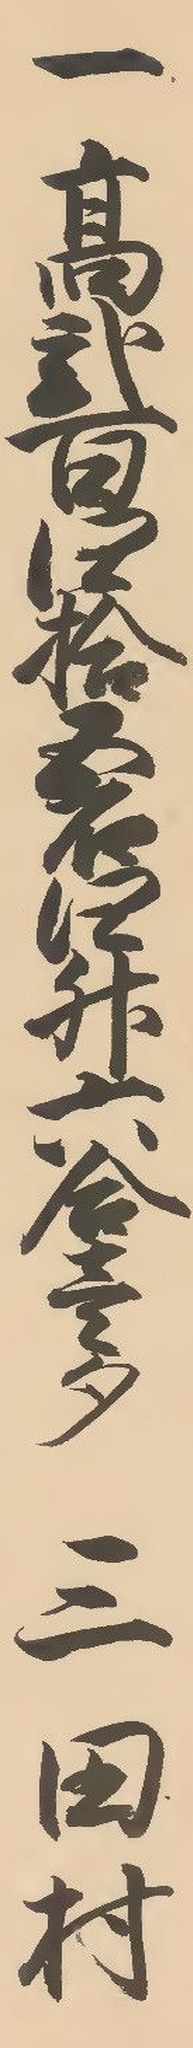一高弐百四拾五石四升六合壱勺三田村
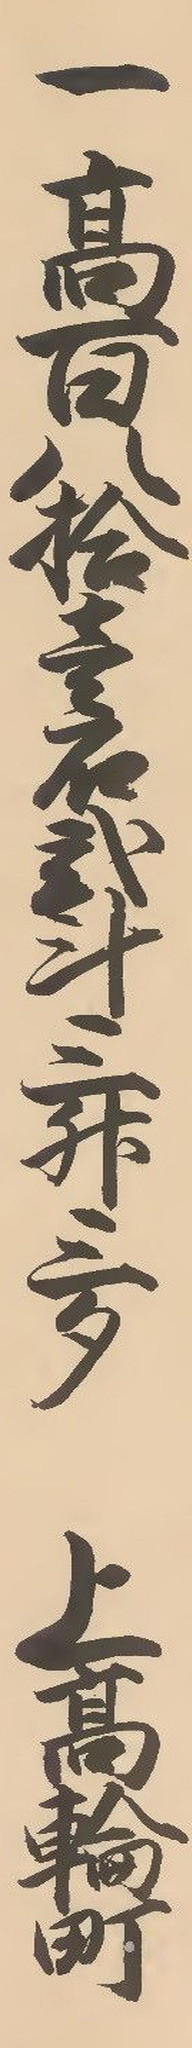一高百八拾壱石弐斗三升三勺上高輪町
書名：武蔵国郷帳　上
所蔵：国立公文書館 National Archives of Japan
